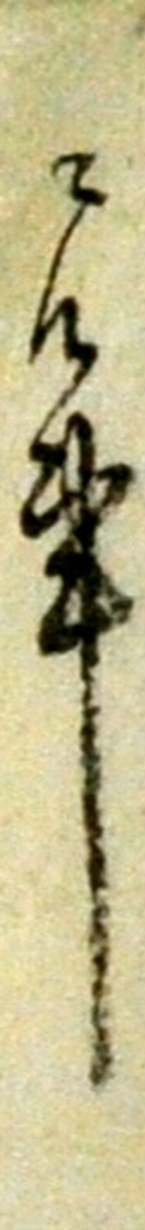ニ候事

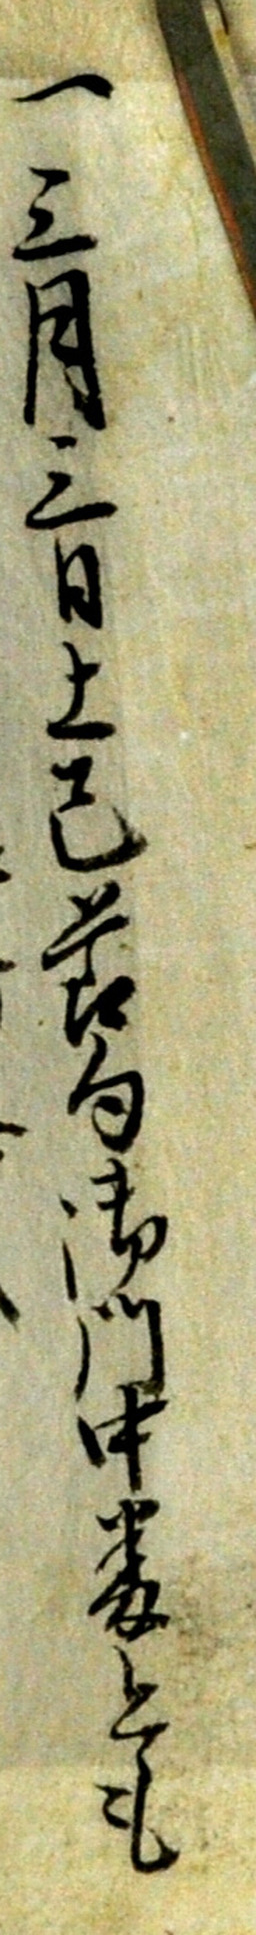一三月三日上巳節句御門中番とも
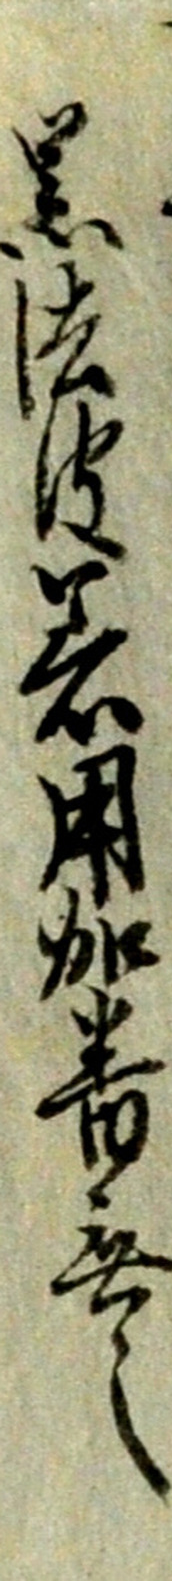黒法被着用加番無之
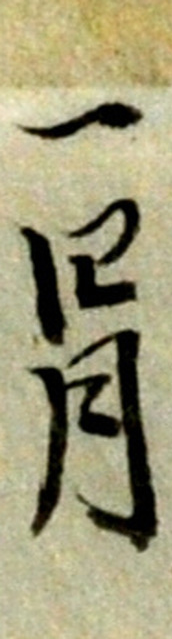一四月
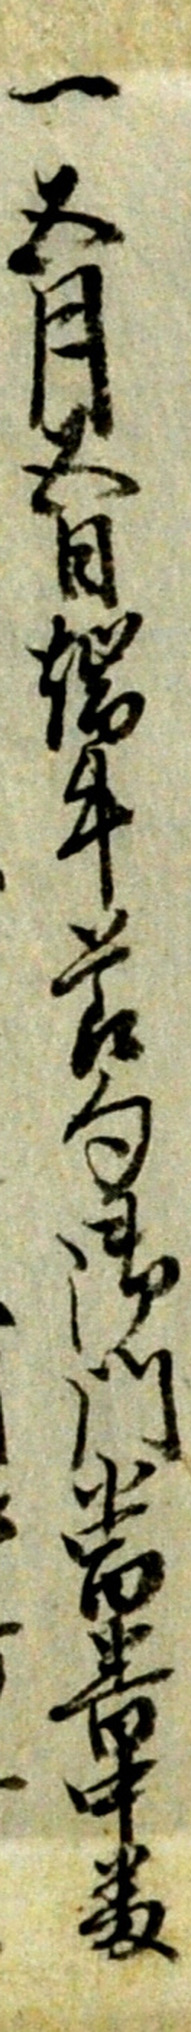一五月五日端午節句御門当番中番
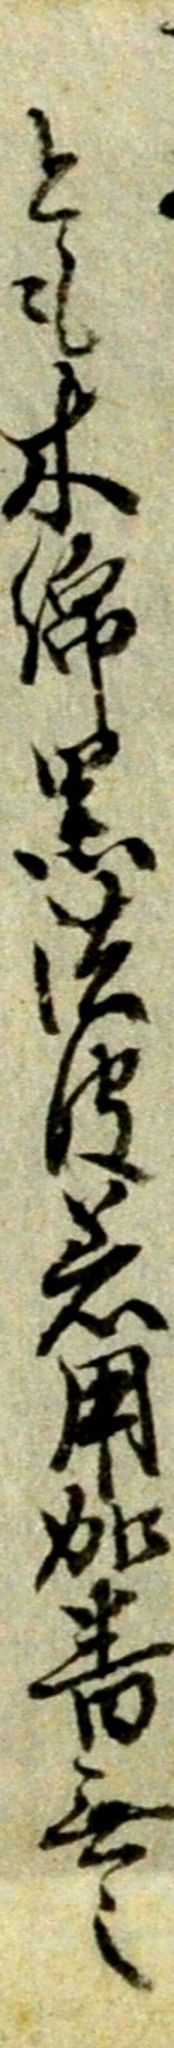とも木綿黒法被着用加番無之
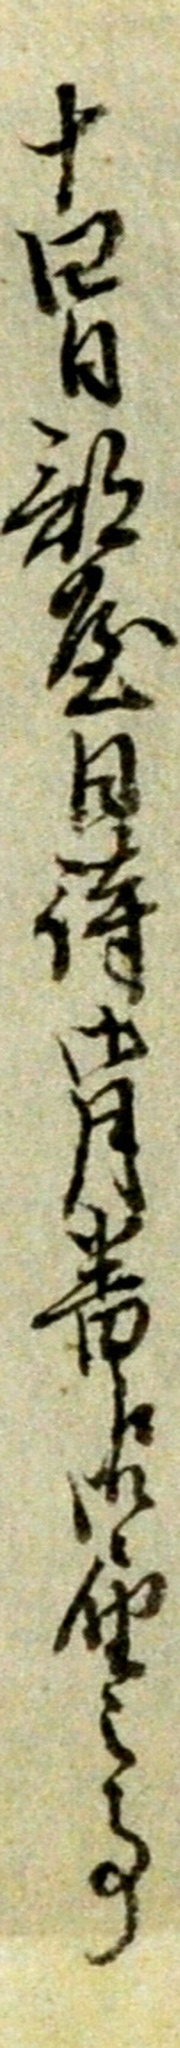十四日部屋日待御月番江御届之事
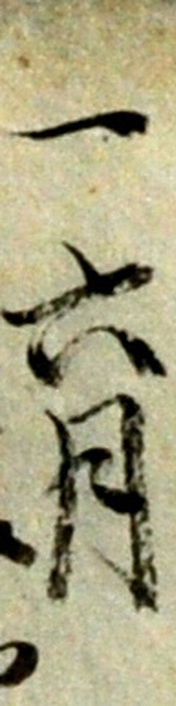一六月
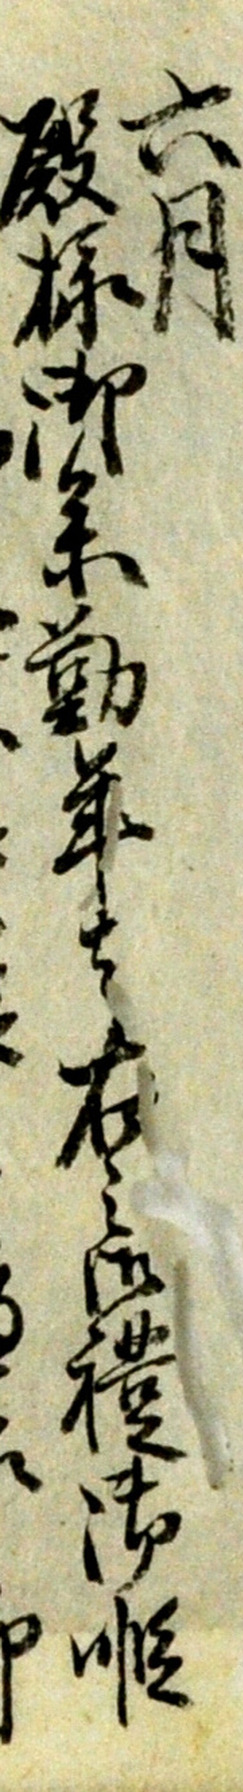殿様御参勤年者右之御礼御暇
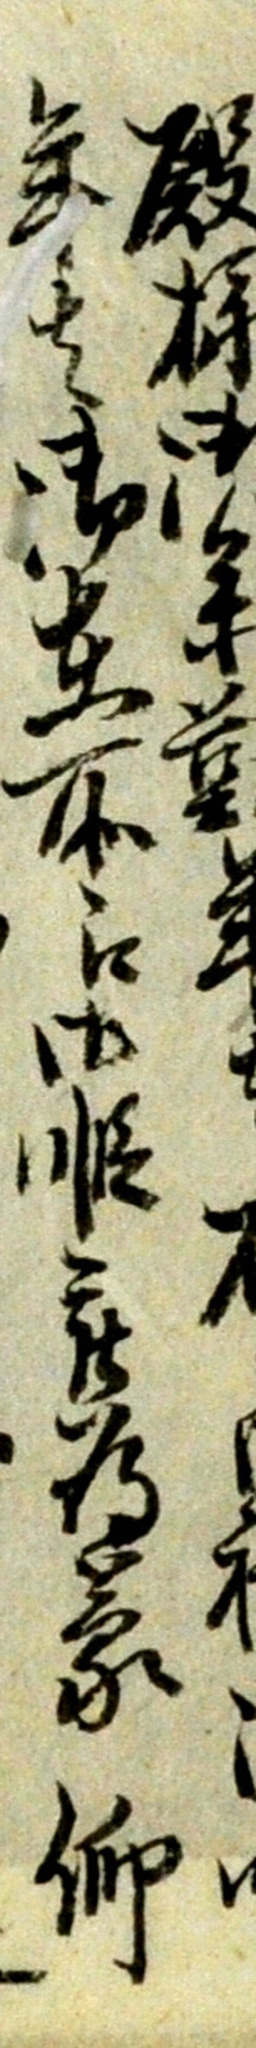年者御在所江御暇被為蒙仰
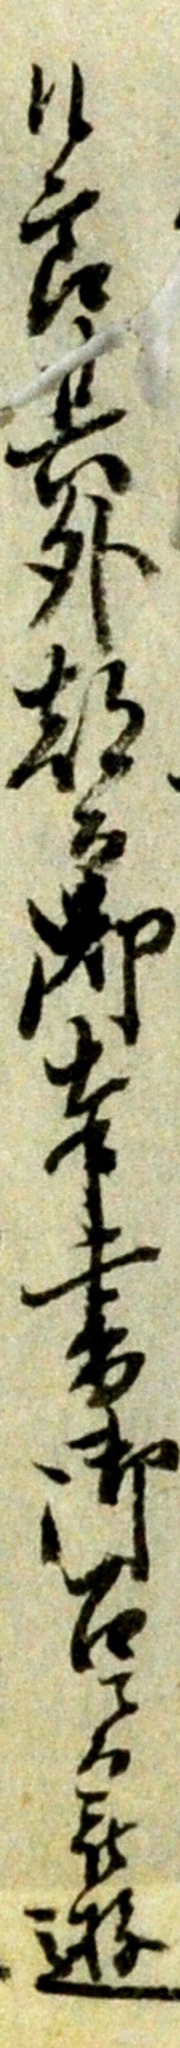候節其外都而御奉書御召ニ而被遊
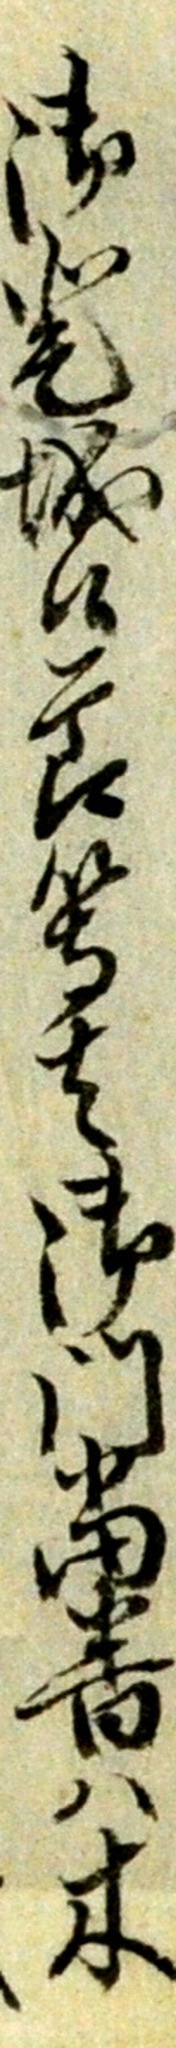御登城候節等者御門当番ハ木
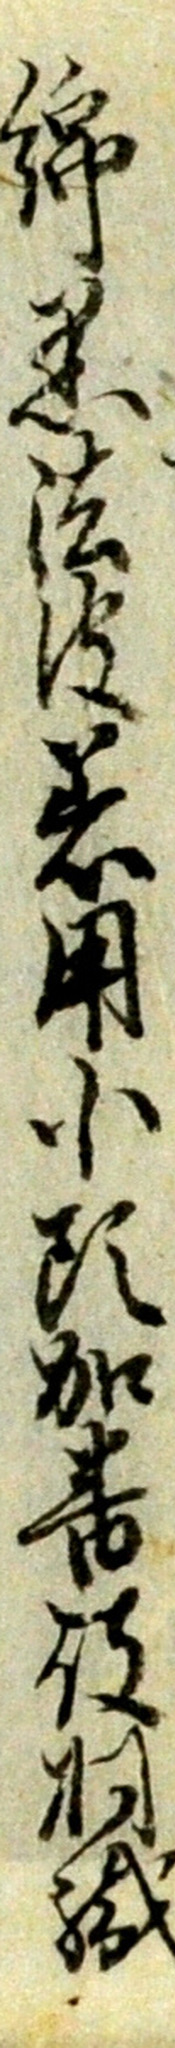綿黒法被着用小頭加番役羽織
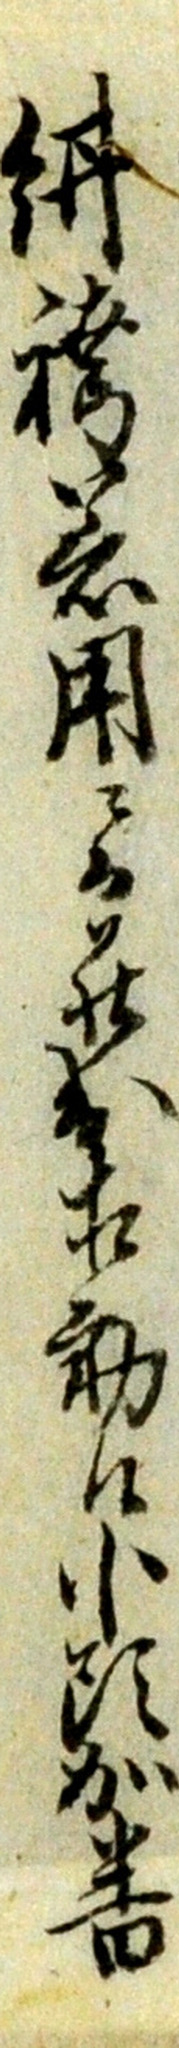絣袴着用ニ而罷出相勤候小頭加番
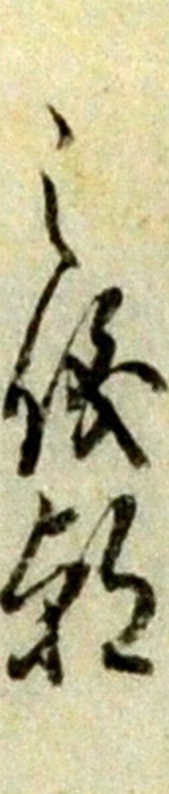之儀朝
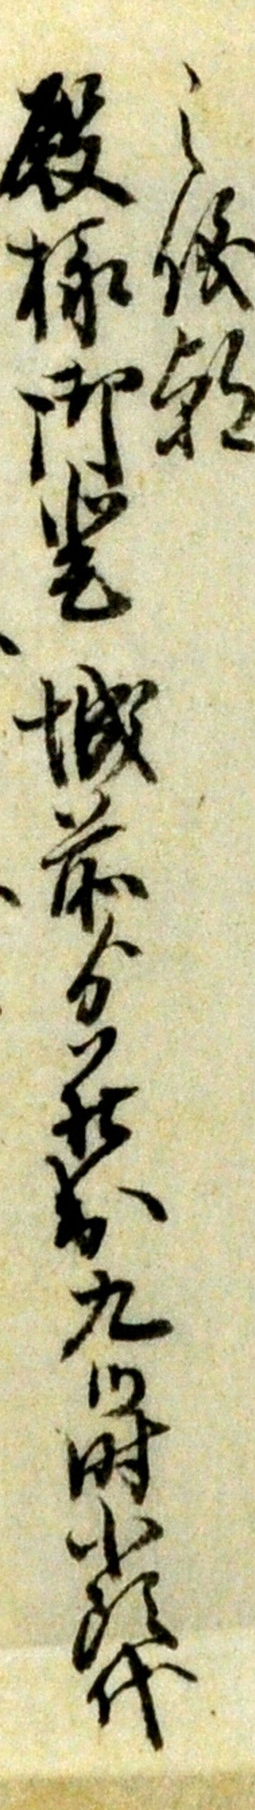殿様御登城前ゟ罷出九ツ時小頭代
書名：御先手組江戸御屋敷御門番勤方
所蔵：伊那市立高遠町図書館・合同会社AMANE
